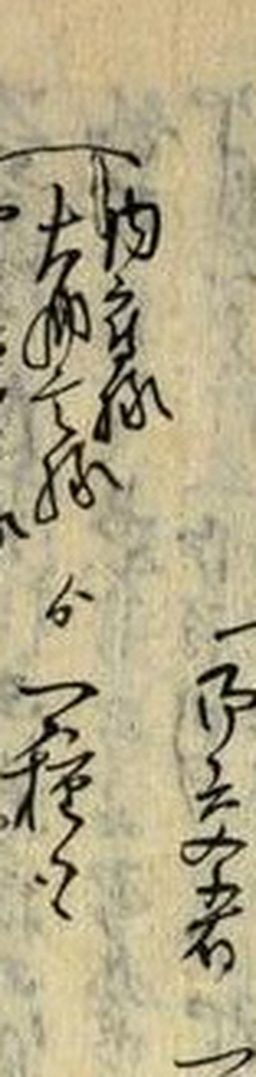大納言様ゟ一種ツヽ
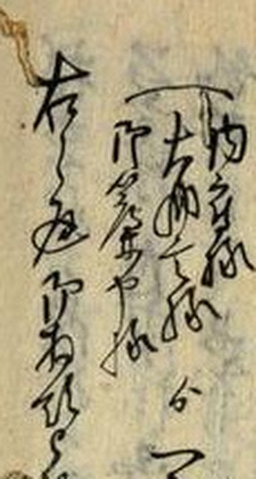御簾中様
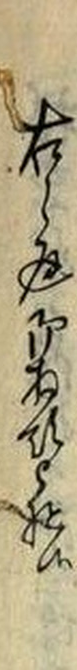右之通御拝領被遊候
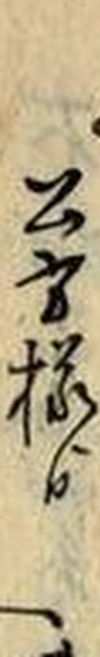公方様ゟ
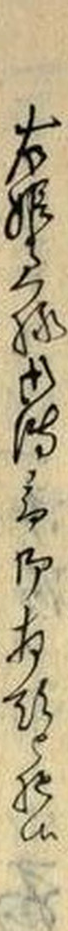右姫君様御伝ニ而御拝領被遊候
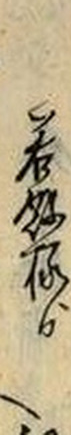若殿様ゟ
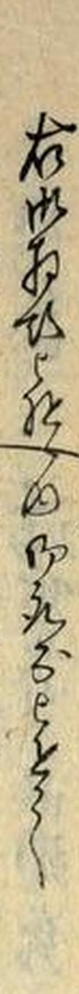右御拝領被遊候内御取分被進之
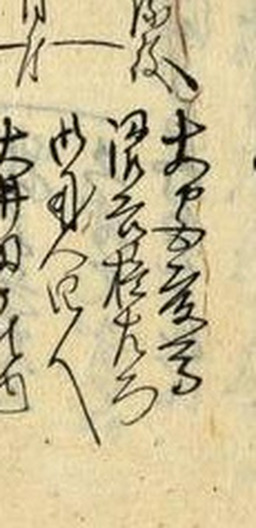渋谷権左衛門
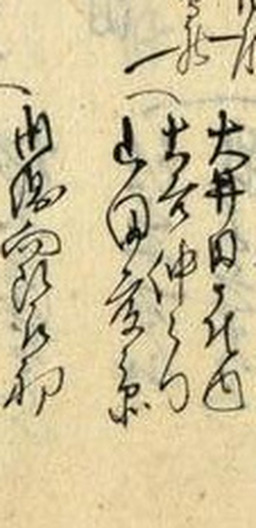山田藤兵衛
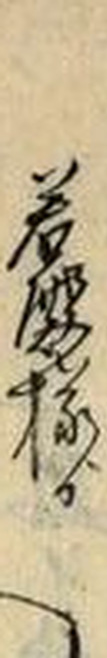若殿様ゟ
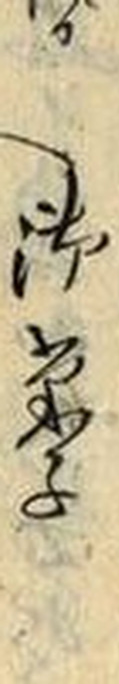御菓子
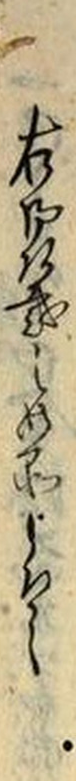右御頂戴之御品被下之

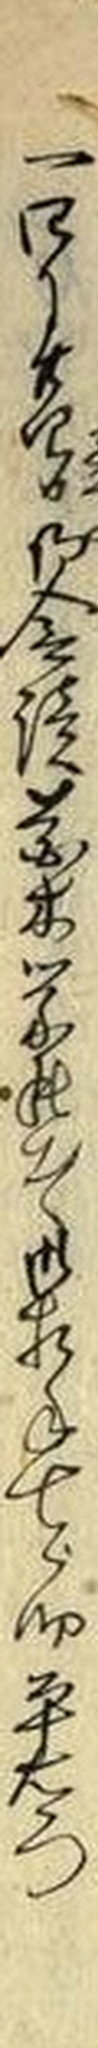一四月廿四日孟子御会読花木栄罷出候御相手七郎助平右衛門
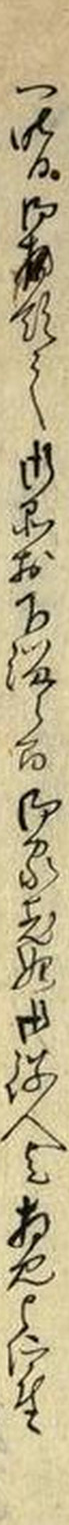一昨日御拝領之御品於下溜之間御家老始御役人迄拝見被仰付候
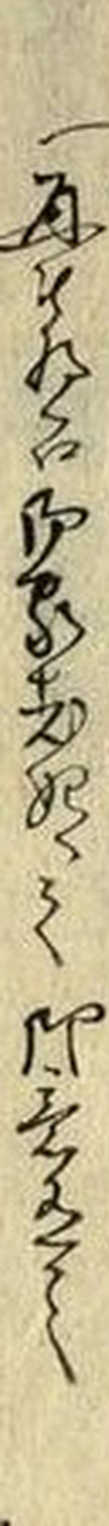再被為召御家老始へ之御意有之
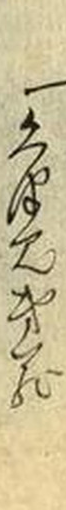久津見弟蔵
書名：少傅日録抄（斉承付側向頭取日記、在府）
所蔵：福井県文書館 Fukui Prefectural Archives
